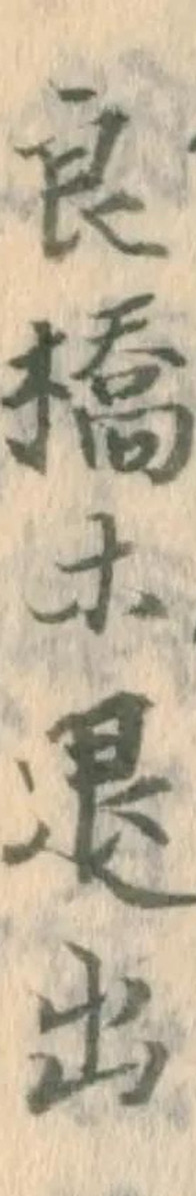良橋等退出
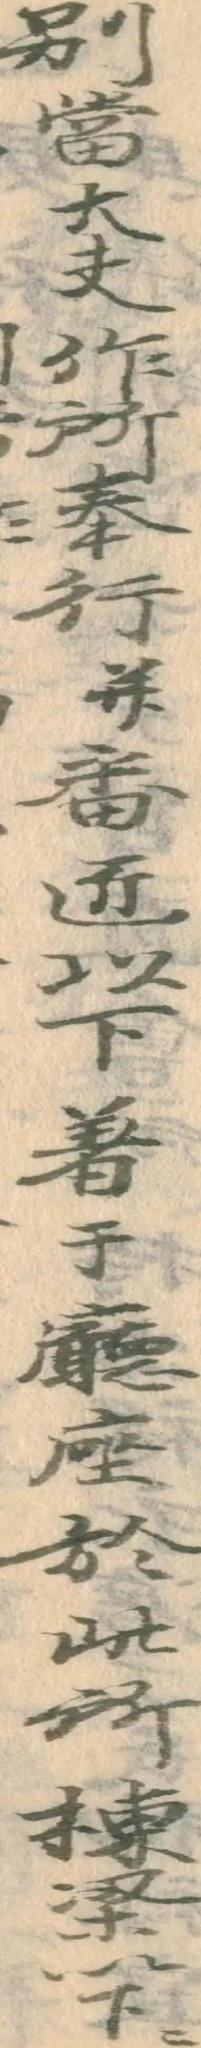別当大夫作所奉行并番匠以下着于庁座於此所棟梁以下ニ
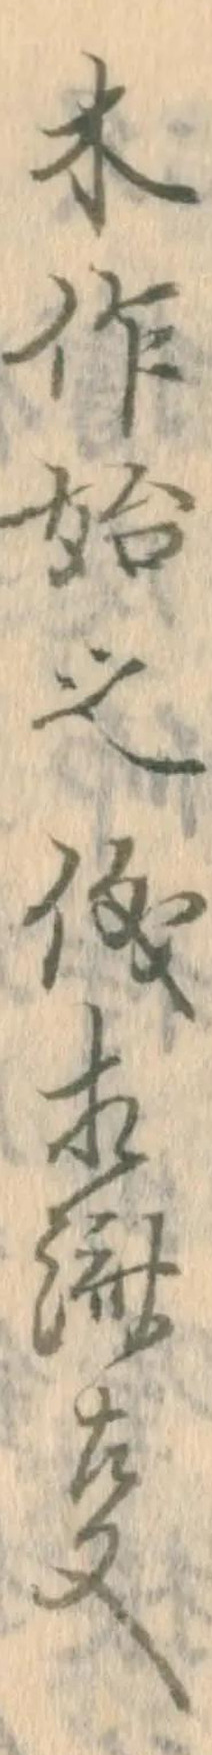木作始之儀相済事
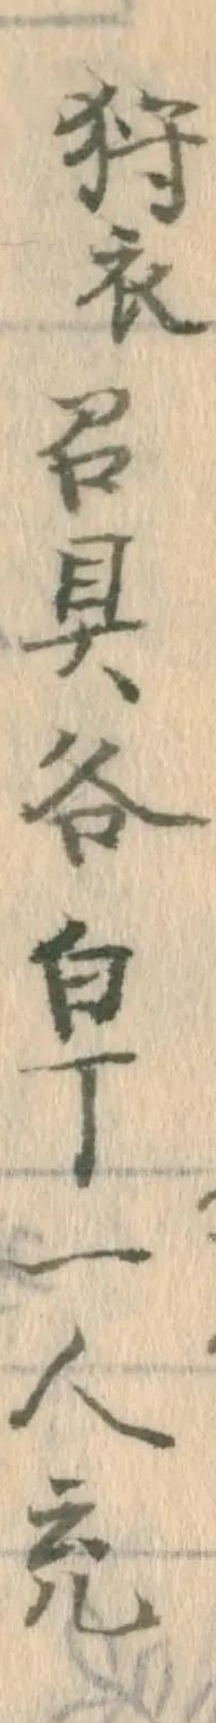狩衣召具各白丁一人充
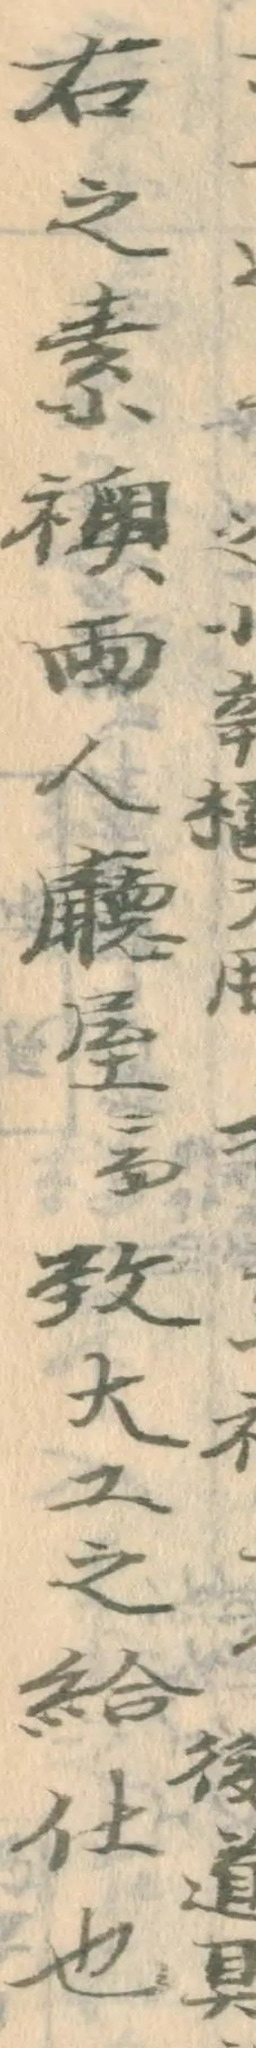右之素襖両人庁屋ニ而致大工之給仕也

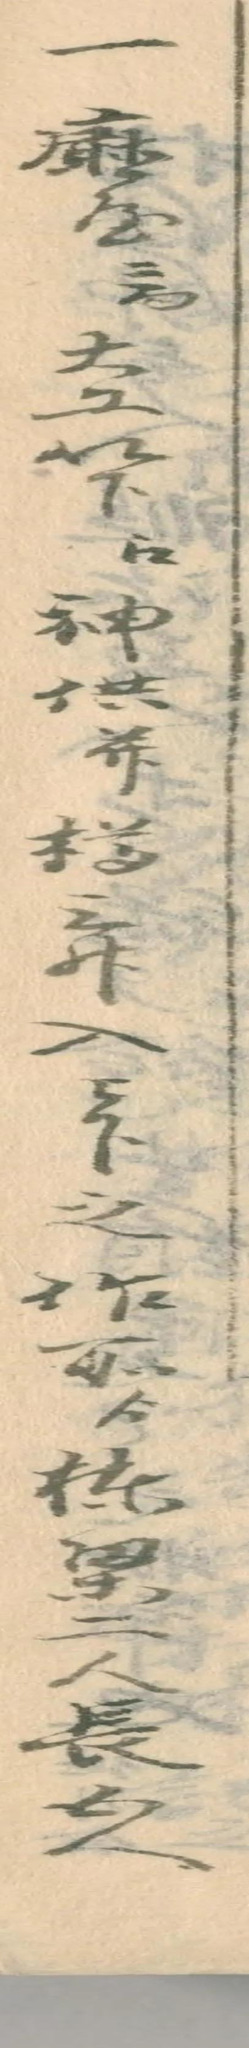一庁屋ニ而大工以下江神供并樽三升入被下之作所ゟ棟梁二人長五人

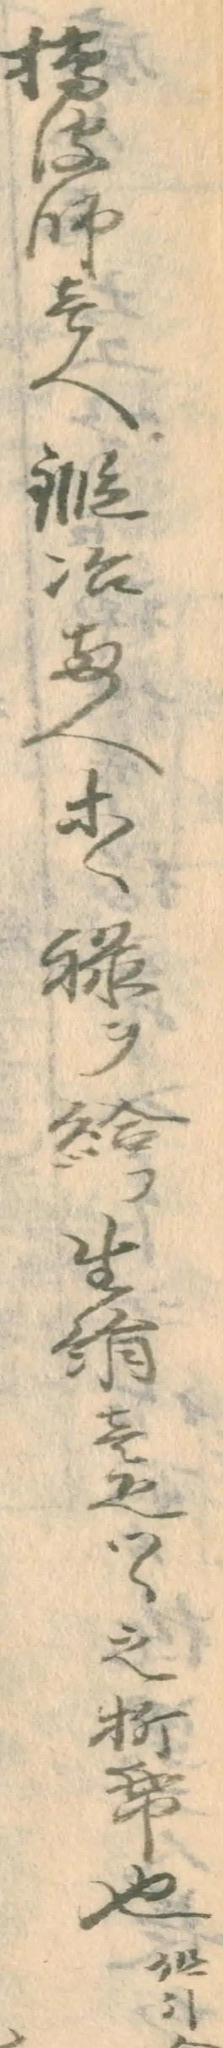檜皮師壱人鍛冶両人等へ禄ヲ給フ生絹壱疋ツヽ之折帋也但引合
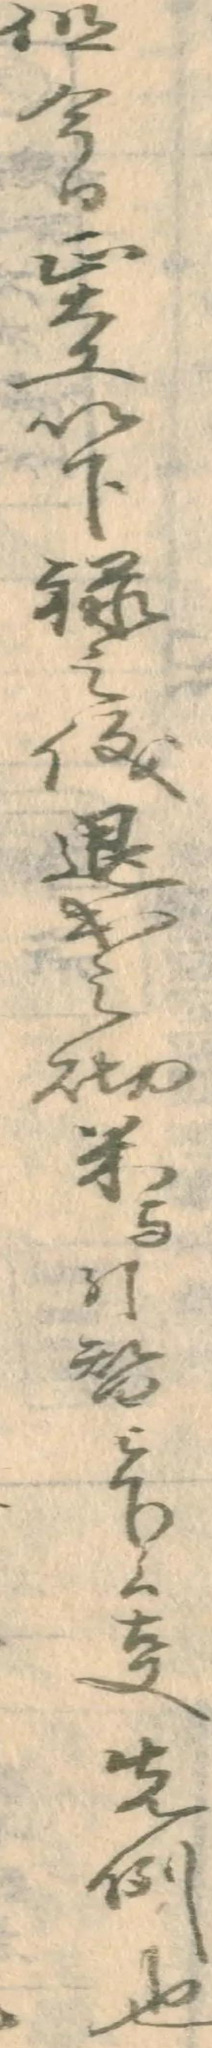但今日正大工以下禄之儀退出之砌米与引替被下候事先例也
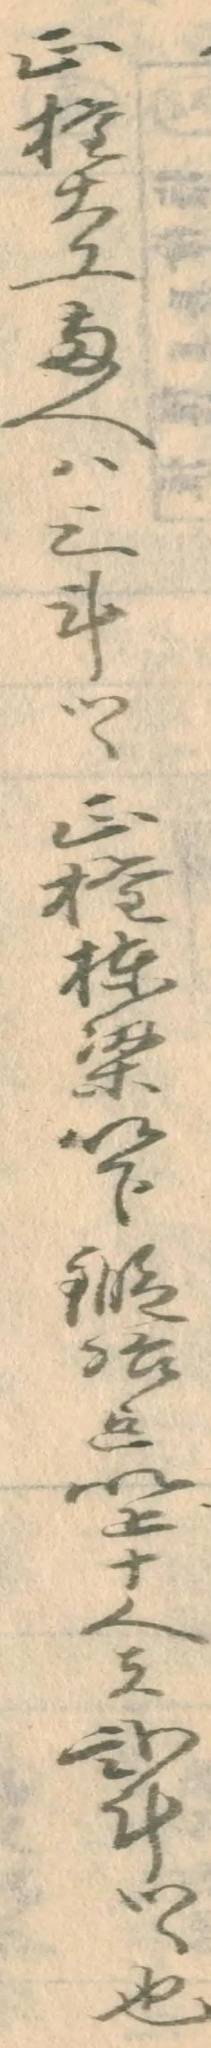正権大工両人ハ三斗ツヽ正権棟梁以下鍛冶迄以上十人は弐斗ツヽ也
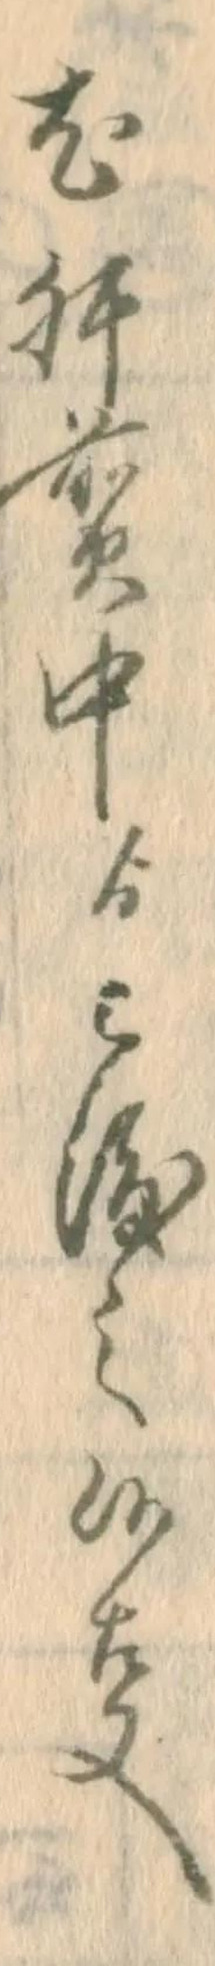尤肝煎中ゟ被渡之候事
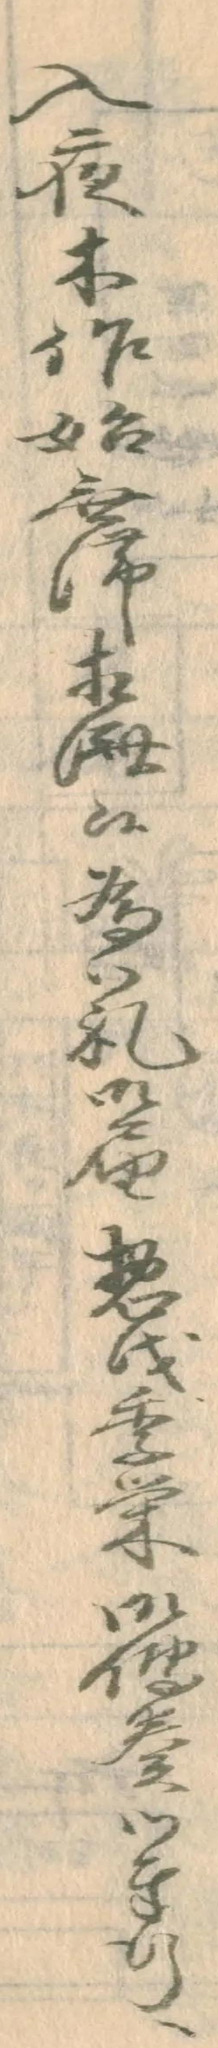一入夜木作始無滞相済候為御礼御届惣代季栄御伝奏御奉行へ
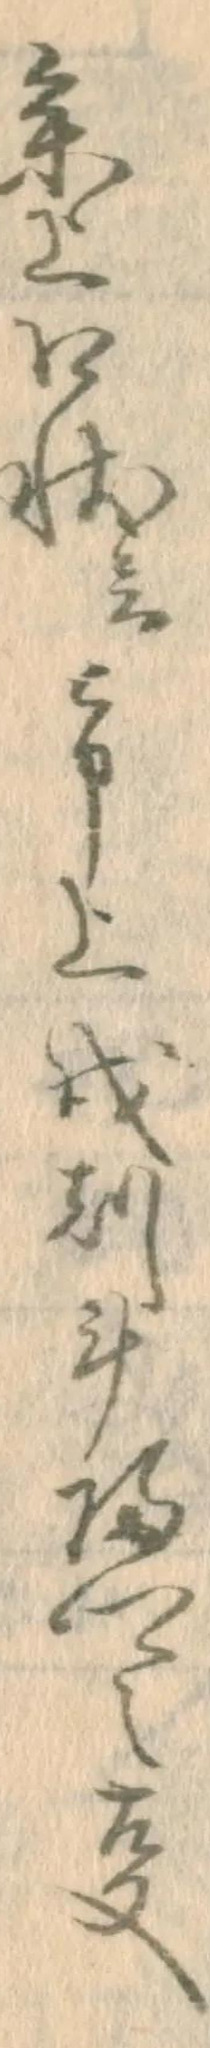参上口状ニ而被申上戌刻計帰郷之事
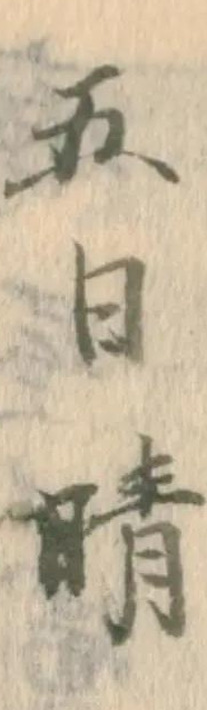五日晴
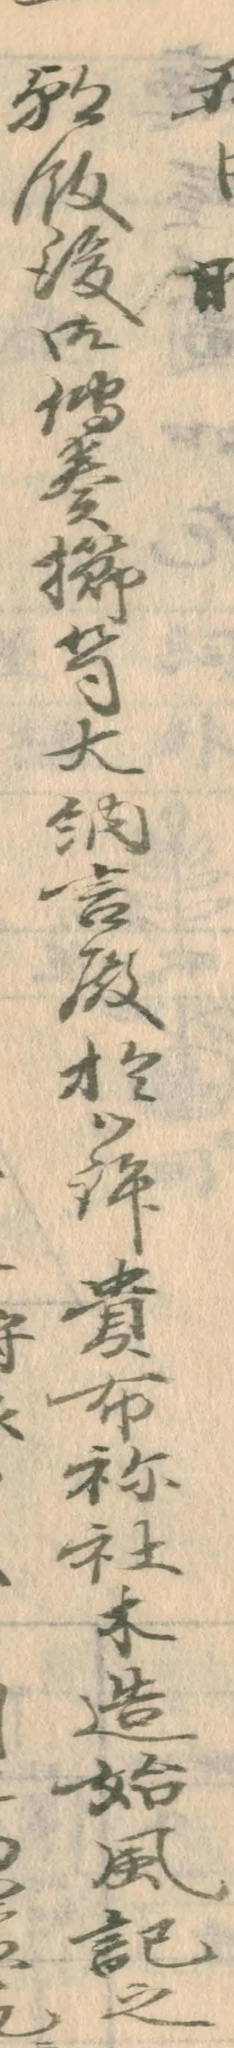一朝飯後御伝奏櫛笥大納言殿於御許貴布祢社木造始風記之
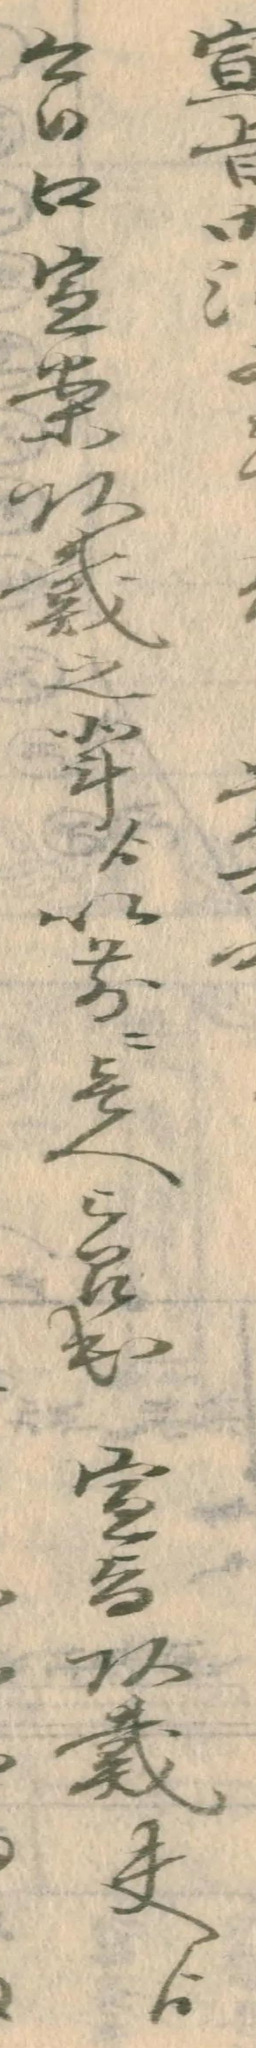今日口宣案頂戴之輩ゟ以前ニ壱人被召出宣旨頂戴夫ゟ
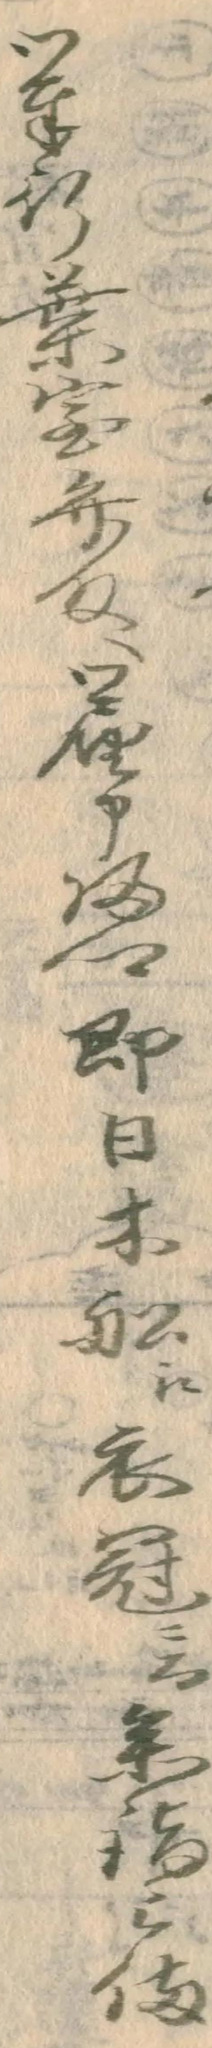御奉行葉室弁殿へ御届申帰郷即日木船江衣冠ニ而参詣被備
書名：賀茂社記録. 第17冊
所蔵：国立国会図書館 National Diet Library, JAPAN
